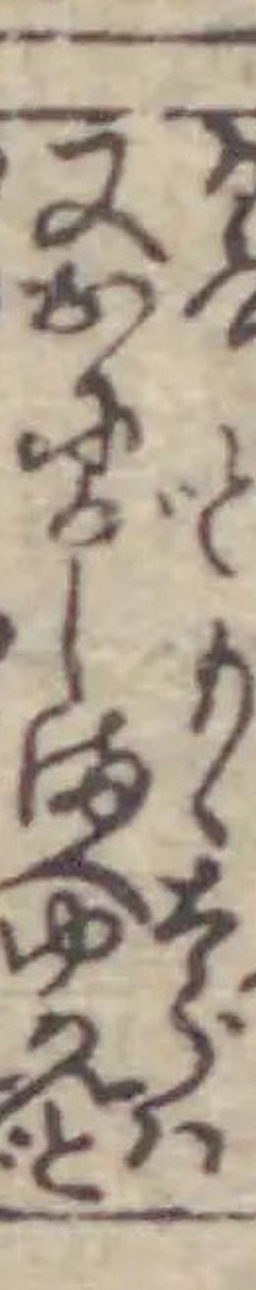又おにがしまへゆかんと
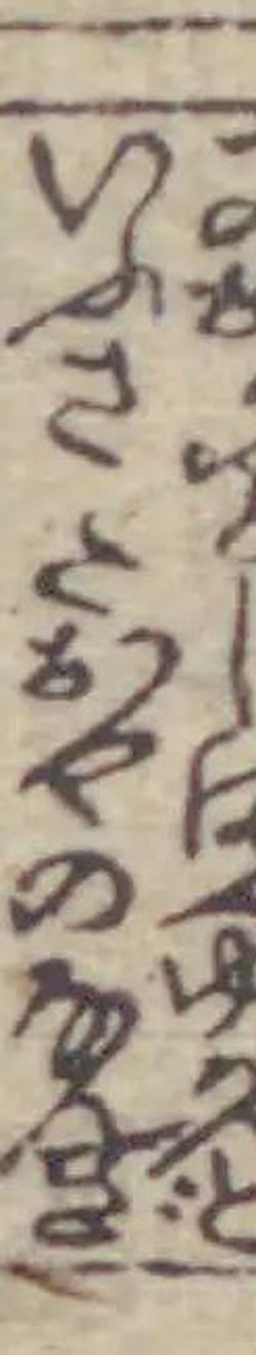いふさとおやのなんぎ
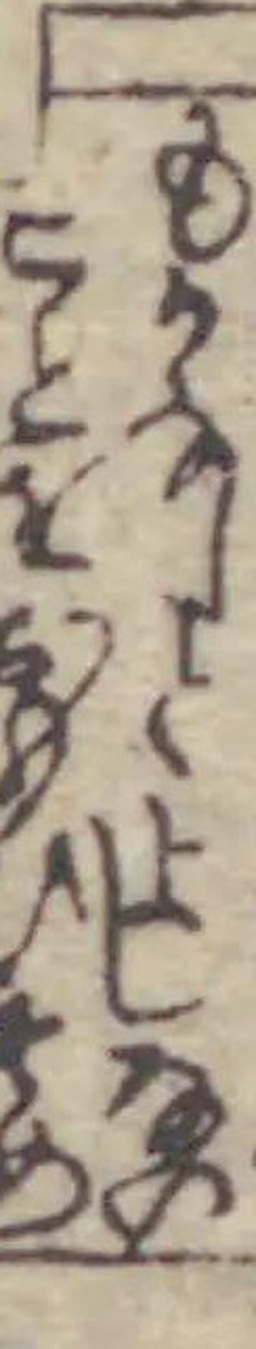ことをおもひそめ
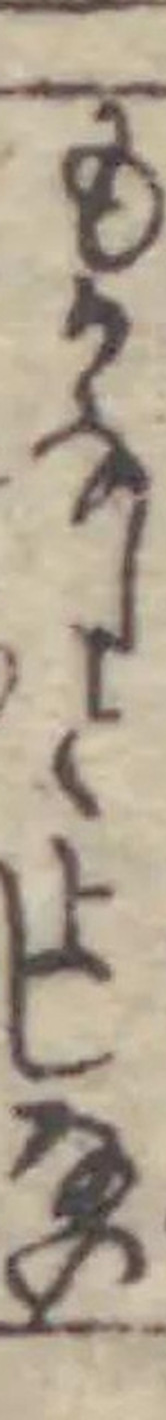もかなしとよしない
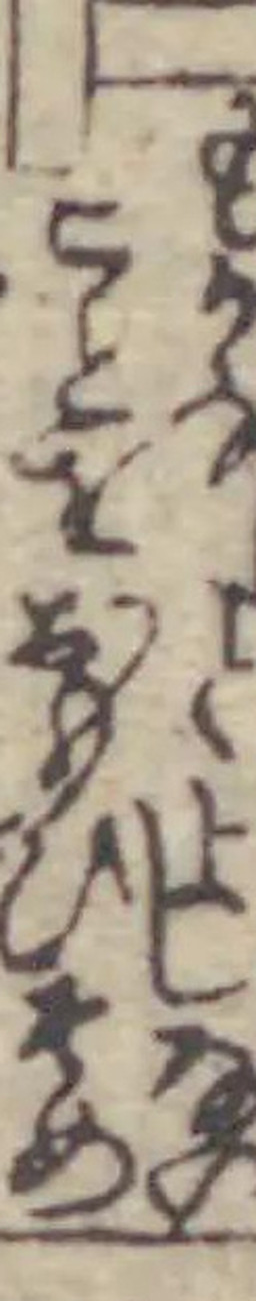ことをおもひそめ
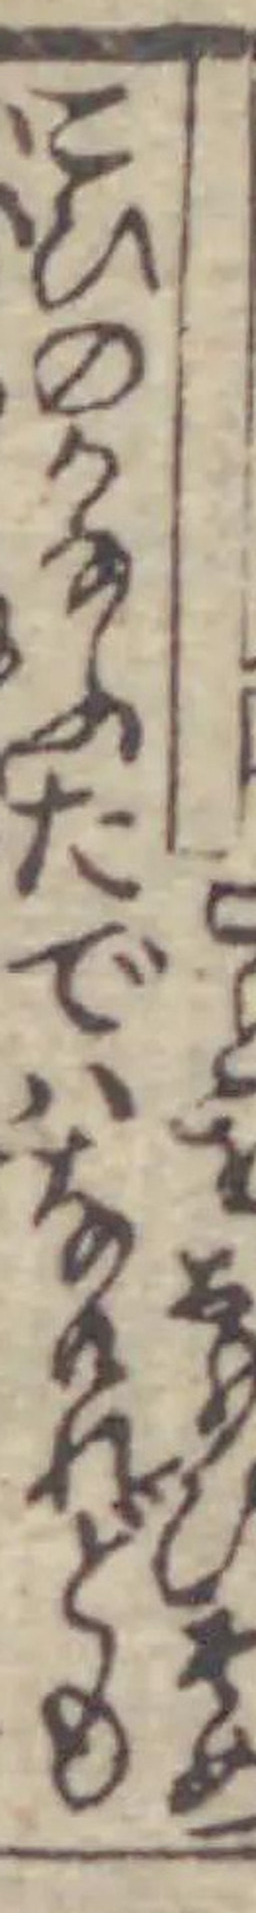こひのかなふたではなけれども
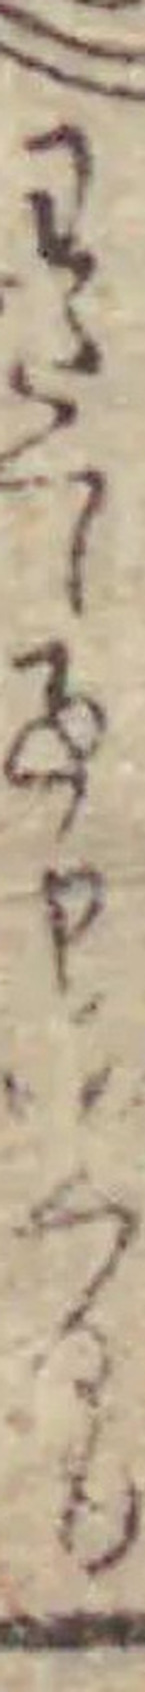わたくし事申あくるも
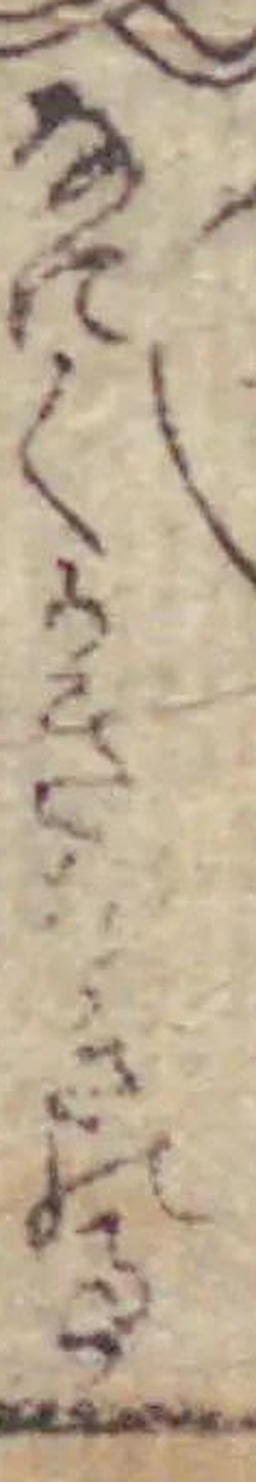なに〳〵かきをきの事
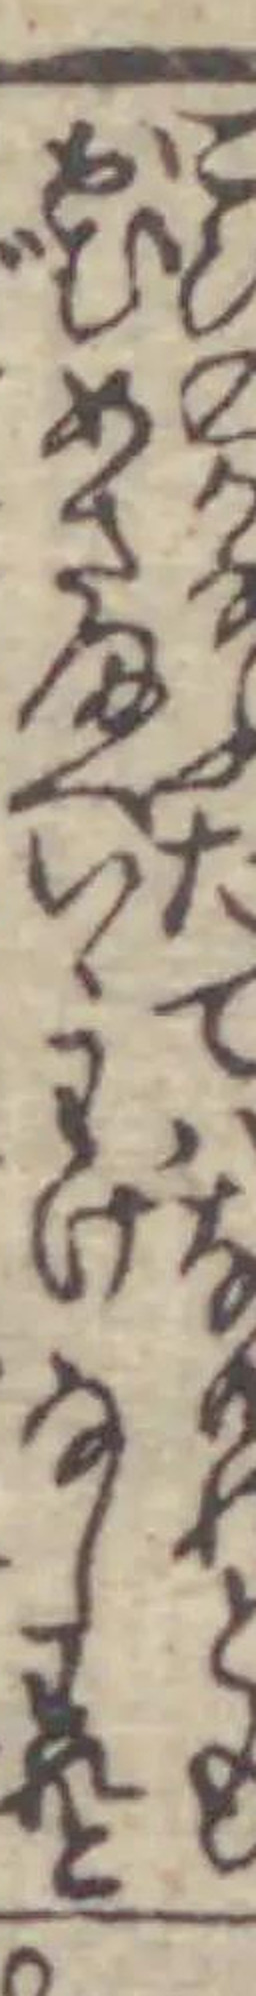おむめさまへいゝわけなしわれと
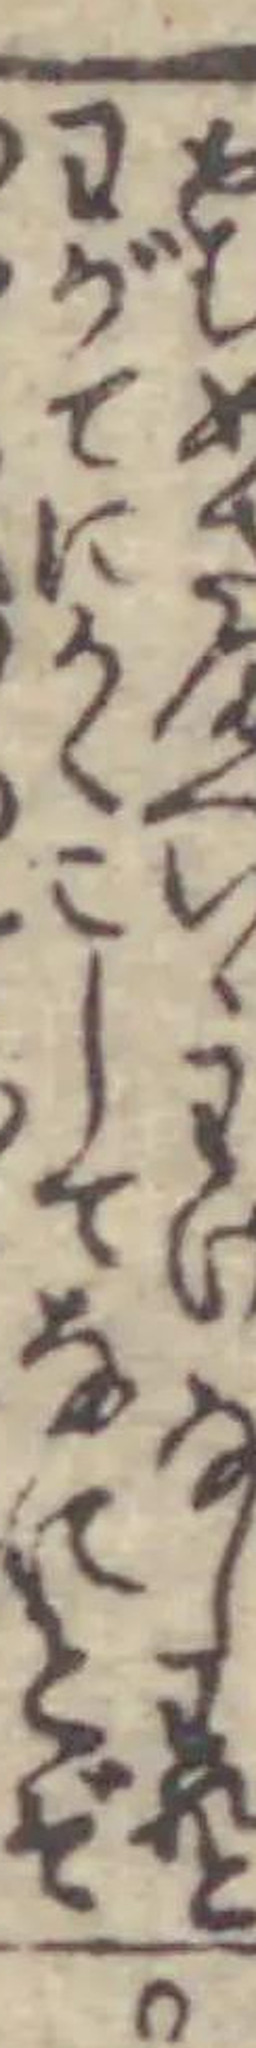わがてにかくこしてなにとぞ
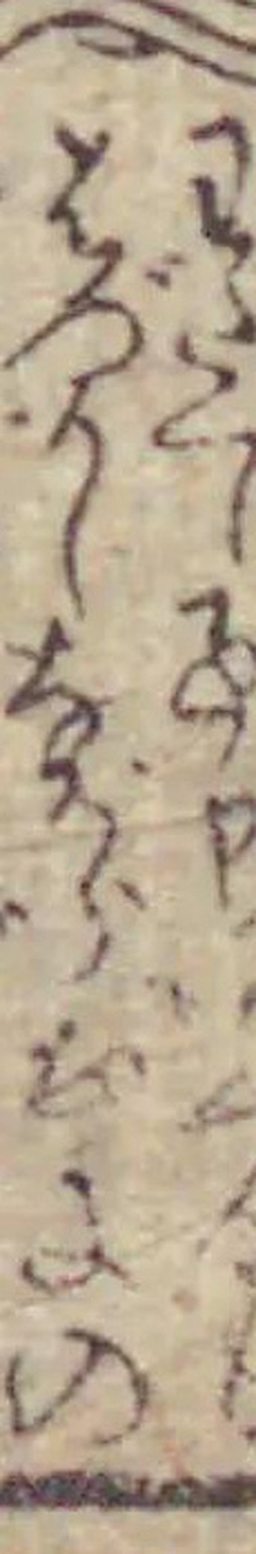はづかしながらおにの
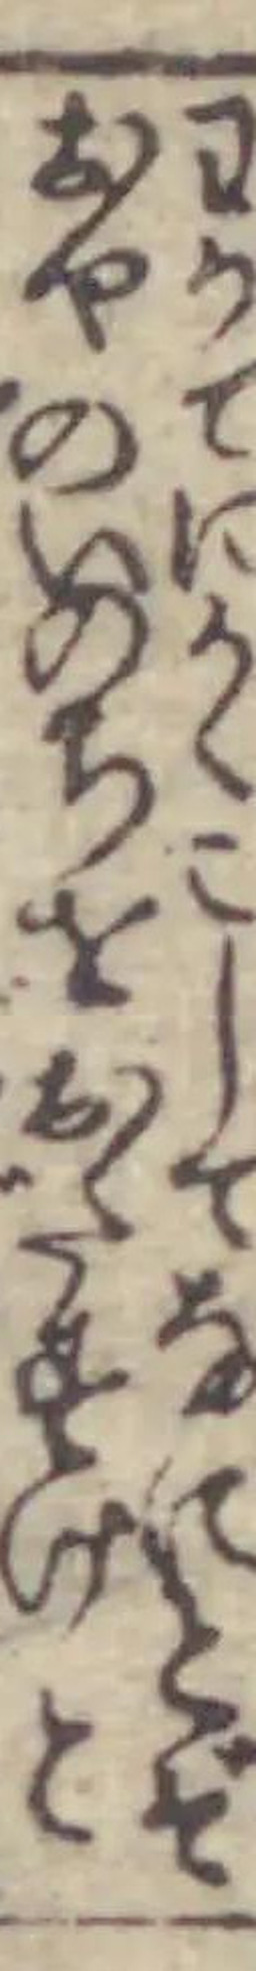おやのいのちをおたすけと
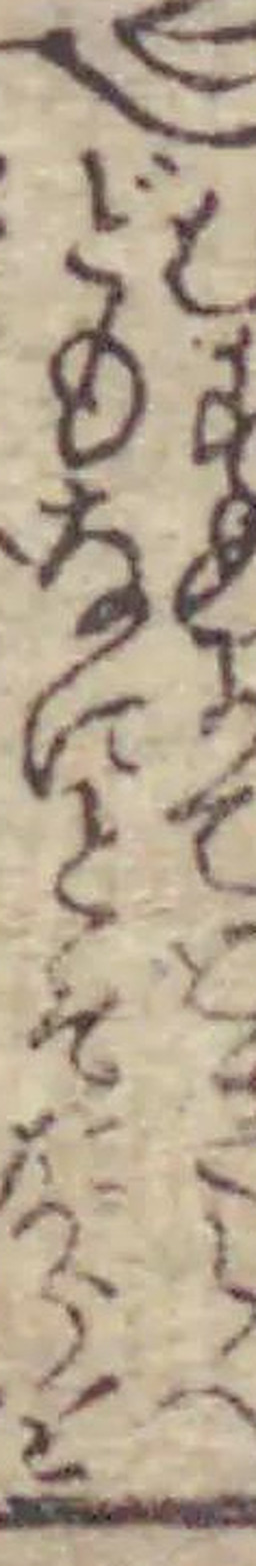どもなにとそたからを
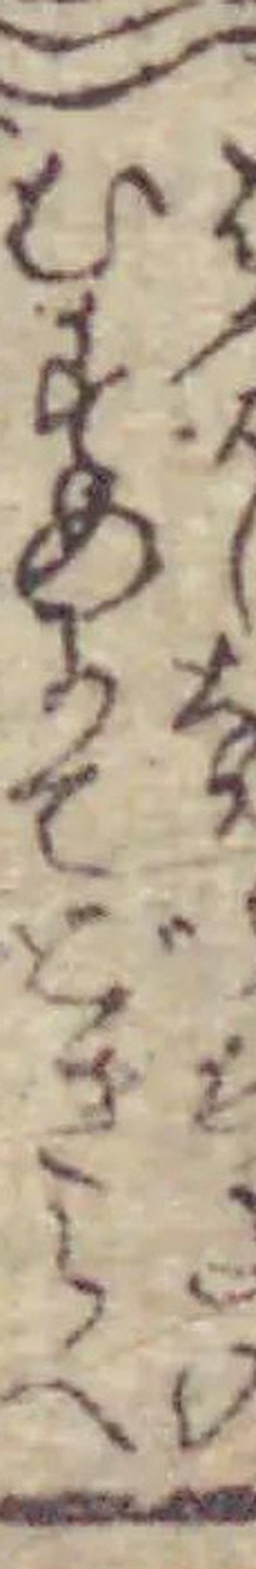むすめにてござ候へ
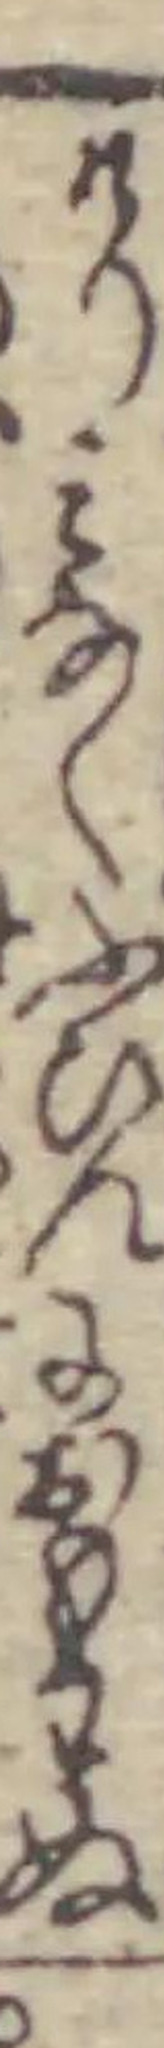けりみな〳〵ふひんにおもわぬ
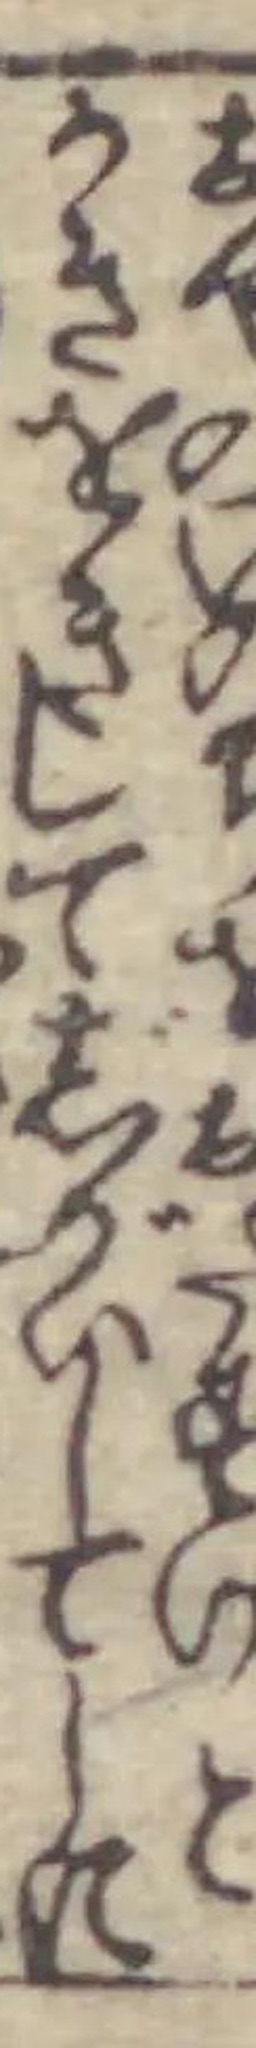かきをきしてじがいしてしに
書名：桃太郎元服姿 2巻
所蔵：国立国会図書館 National Diet Library, JAPAN
